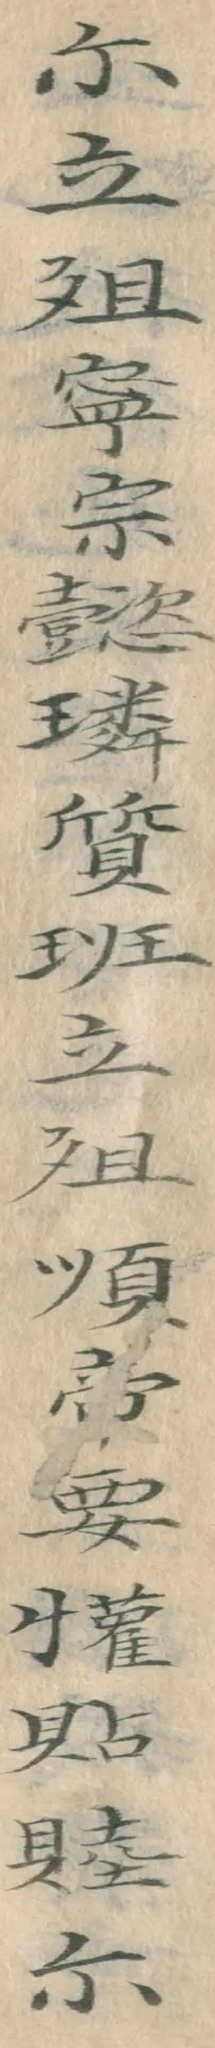尓立殂寧宗懿璘質班立殂順帝要懽帖睦尓
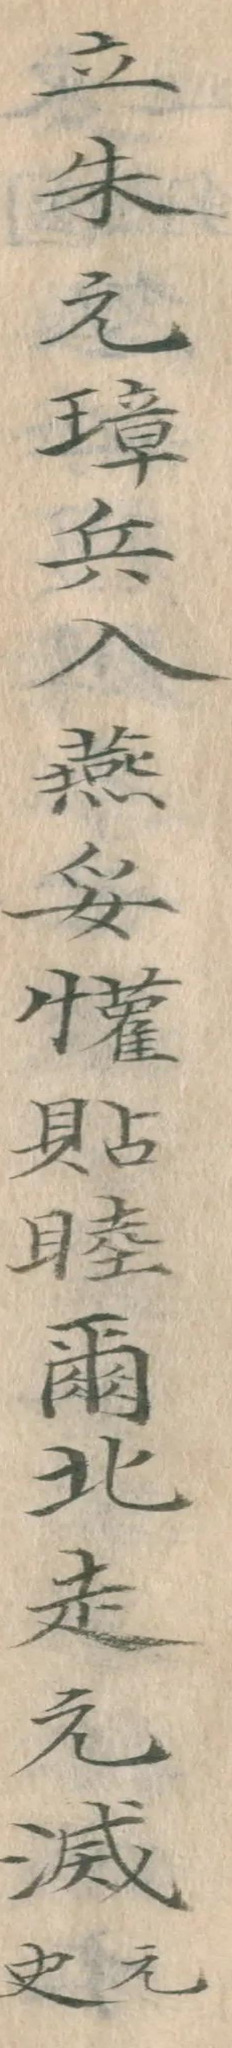立朱元璋兵入燕妥懽帖睦爾北走元滅元史

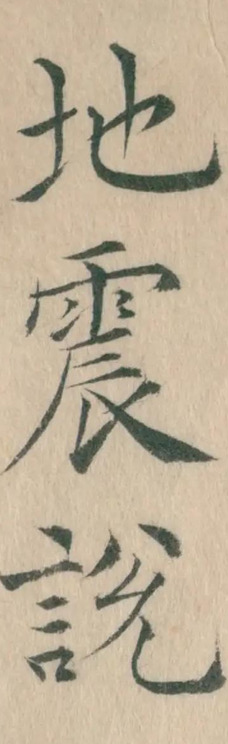地震説

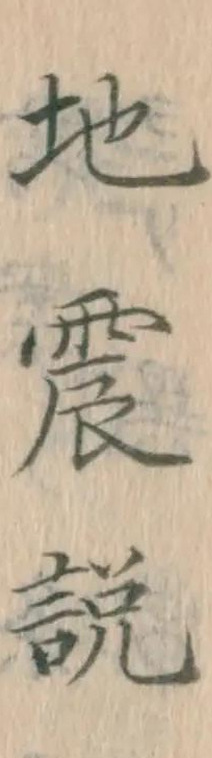地震説
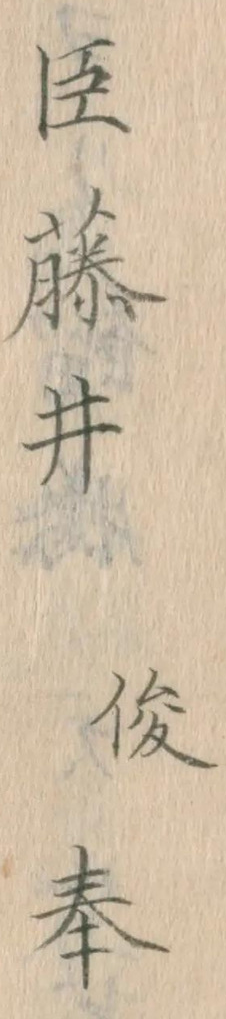臣藤井俊奉
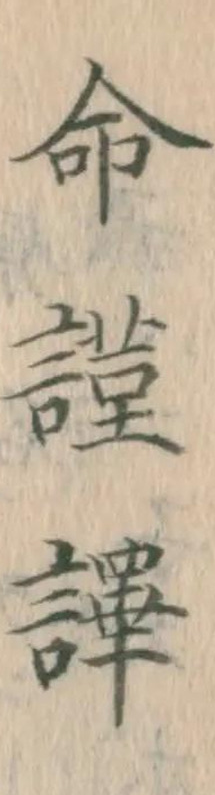命謹訳
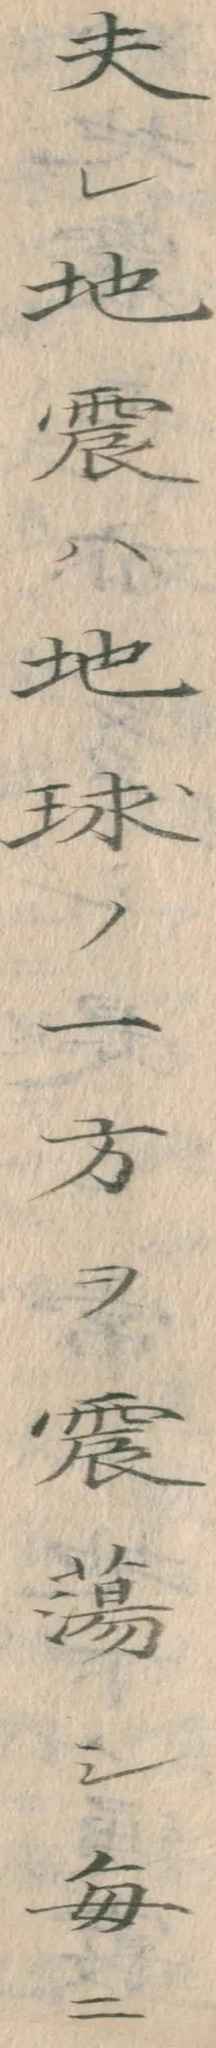夫レ地震ハ地球ノ一方ヲ震蕩シ毎ニ
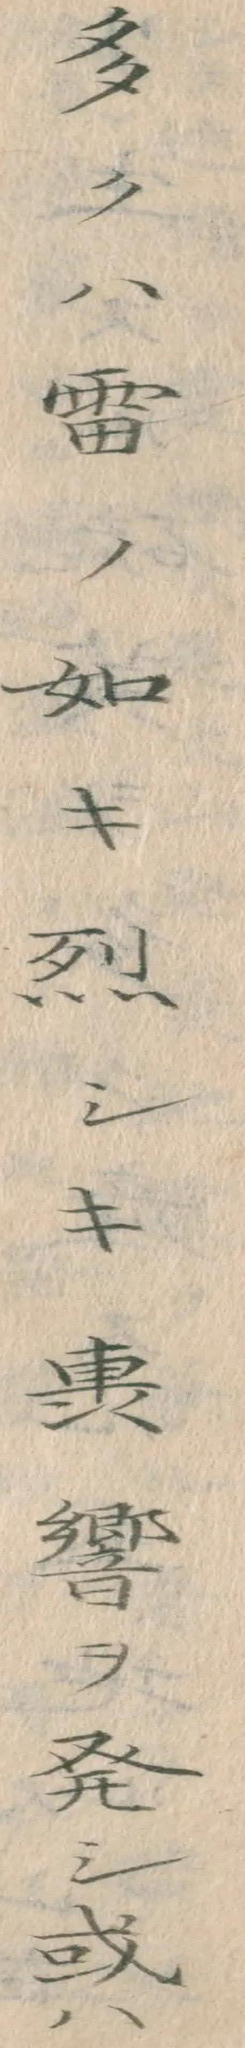多クハ雷ノ如キ烈シキ轟響ヲ発シ或ハ
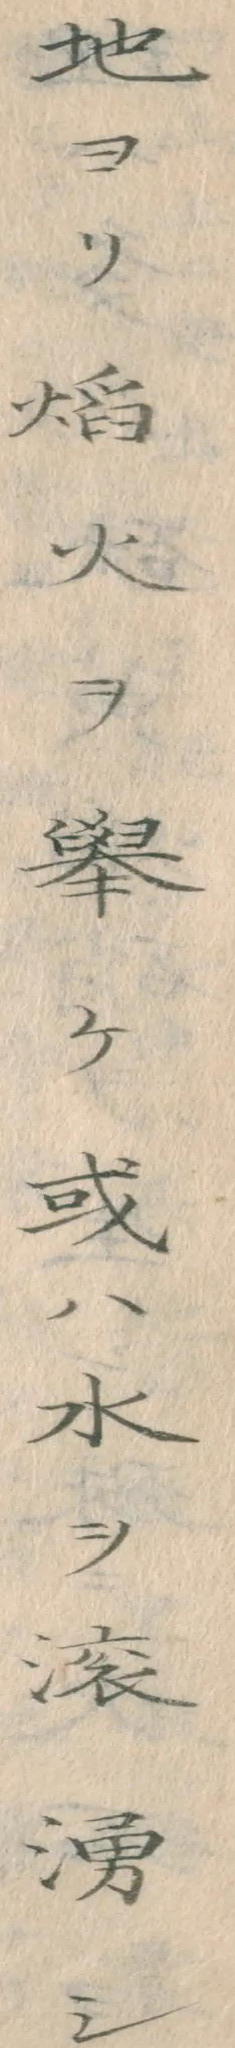地ヨリ焔火ヲ挙ケ或ハ水ヲ滚湧シ
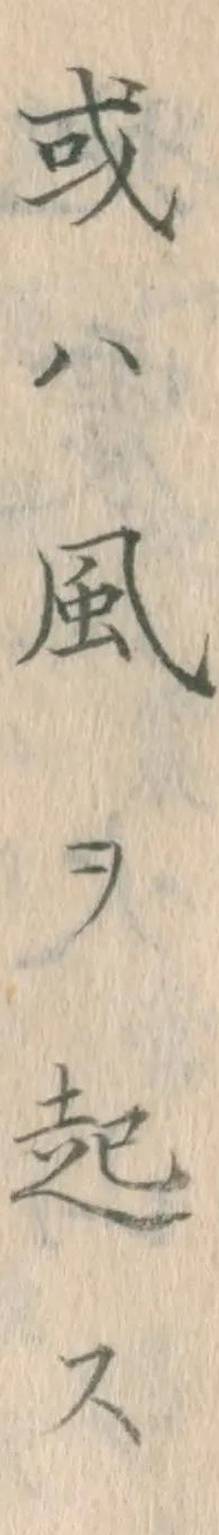或ハ風ヲ起ス

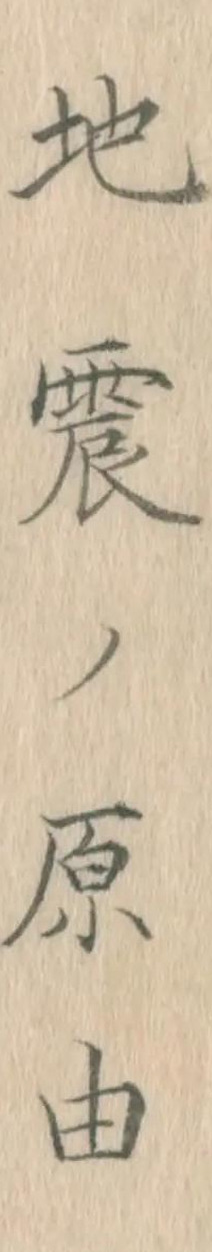地震の原由
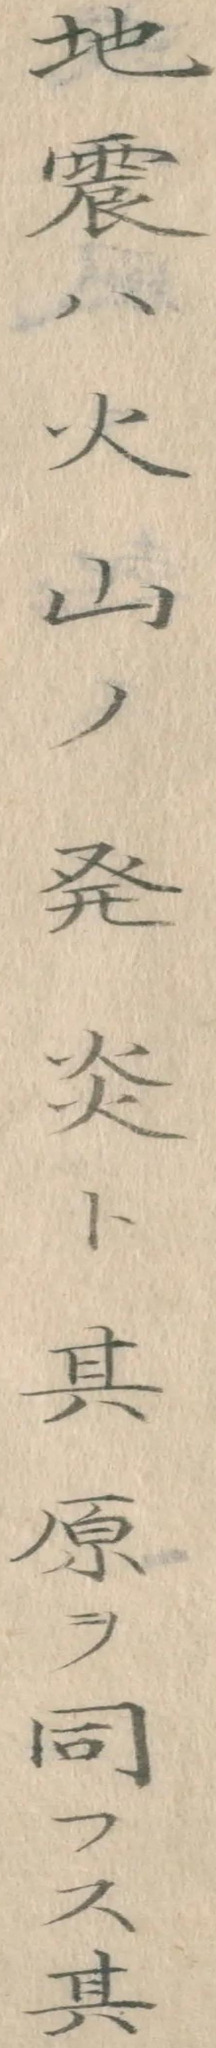地震ハ火山ノ発炎ト其原ヲ同フス其
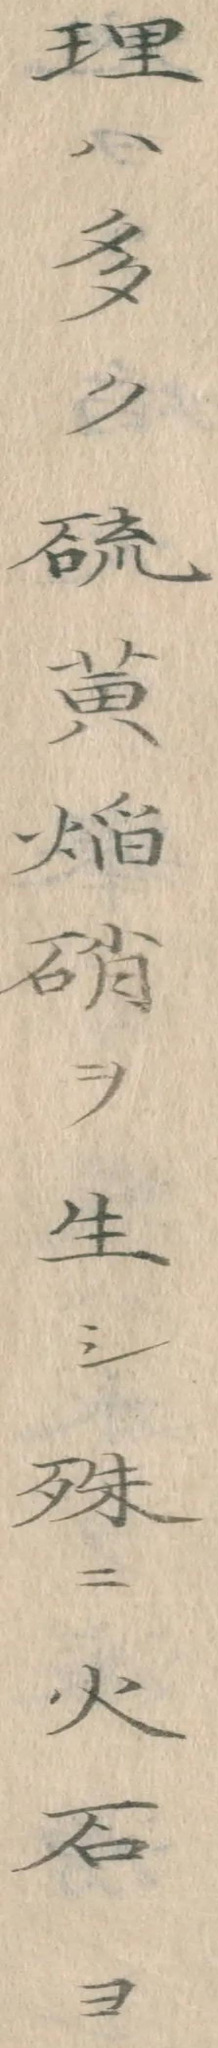理ハ多ク硫黄㷔硝ヲ生シ殊ニ火石ヨ
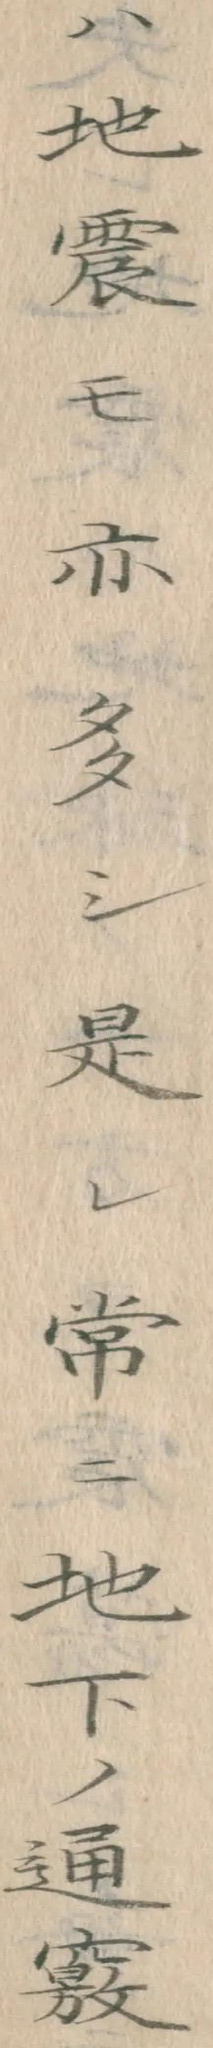ハ地震モ亦多シ是レ常ニ地下ノ通竅

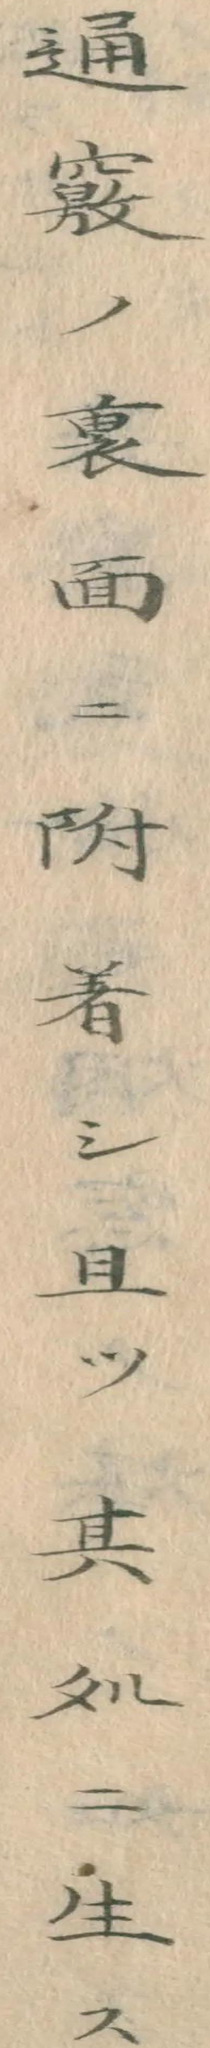通竅ノ裏面ニ附着シ且ツ其処ニ生ス
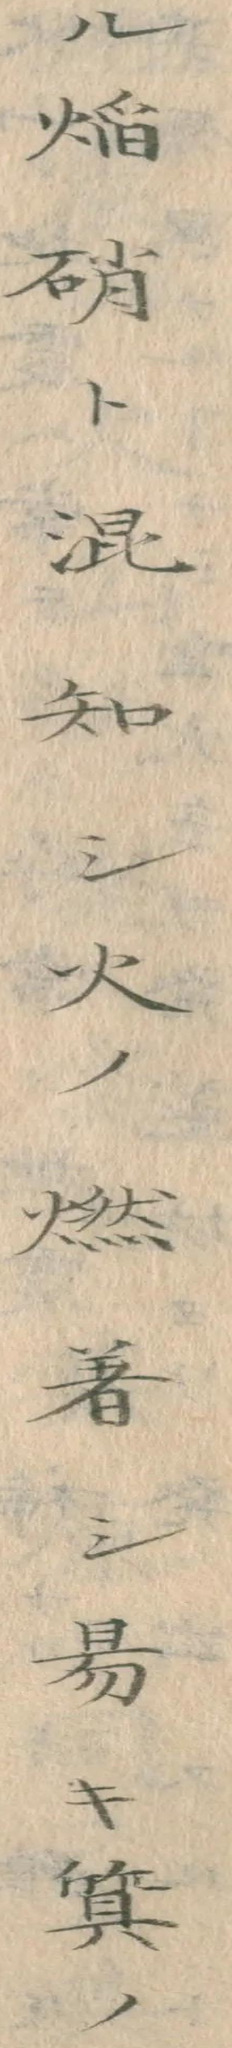ル焔硝ト混知シ火ノ燃著シ易キ質ノ
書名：輪池叢書. 12
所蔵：国立国会図書館 National Diet Library, JAPAN
